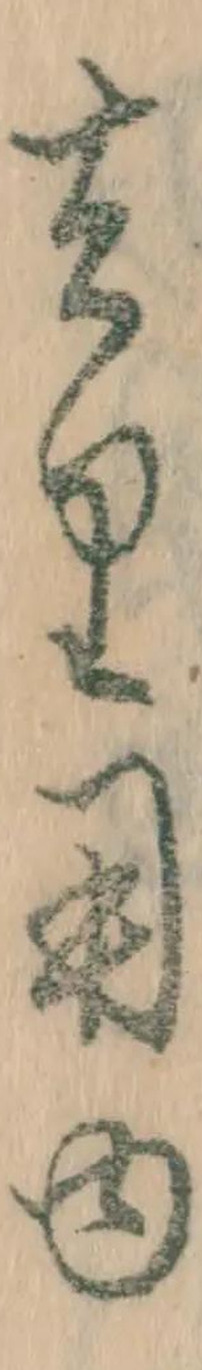去り用ゆ
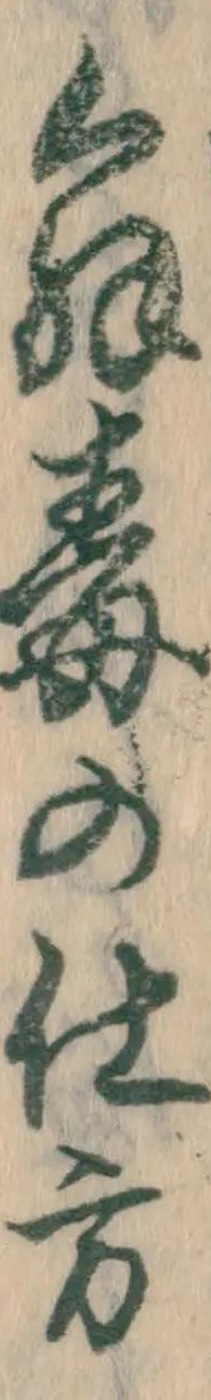解毒の仕方
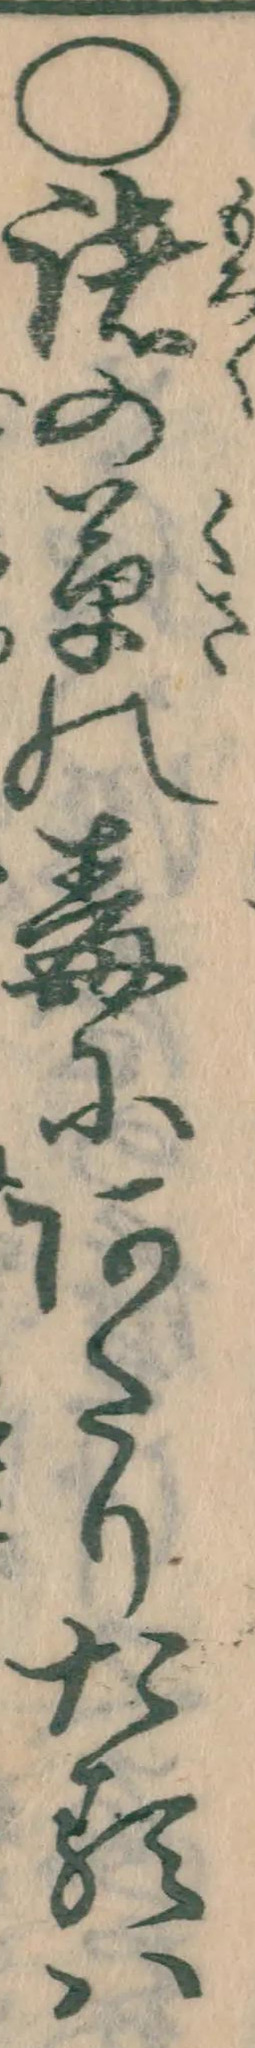〇諸の草の毒にあたりたるは
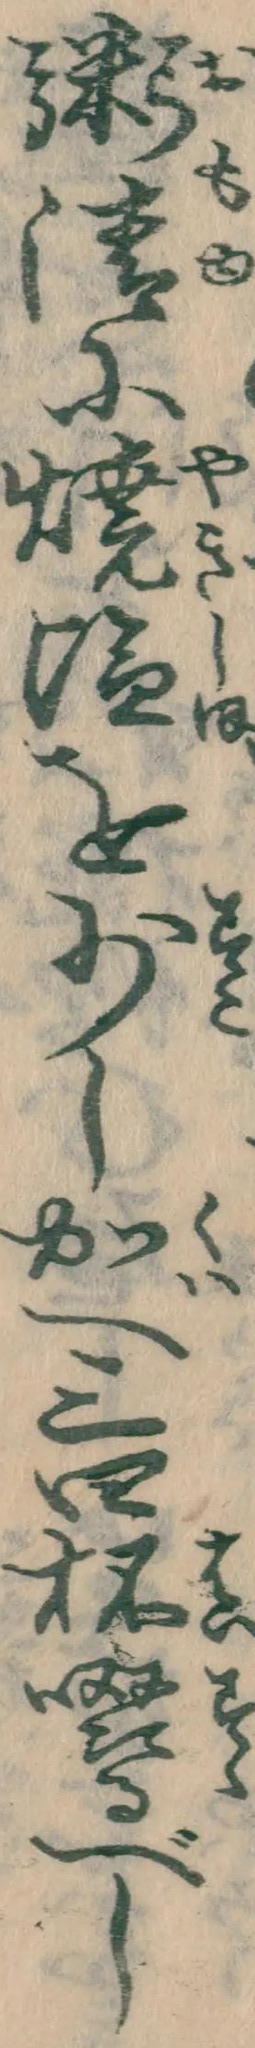粥清に焼塩を少し加へ三四杯啜るべし
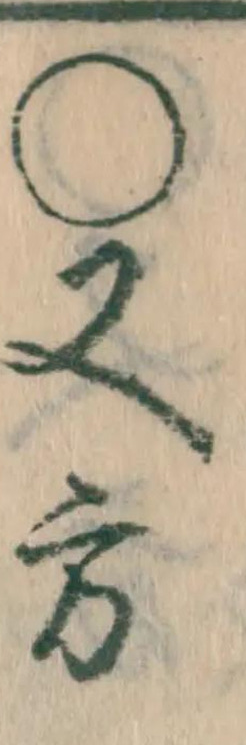〇又方
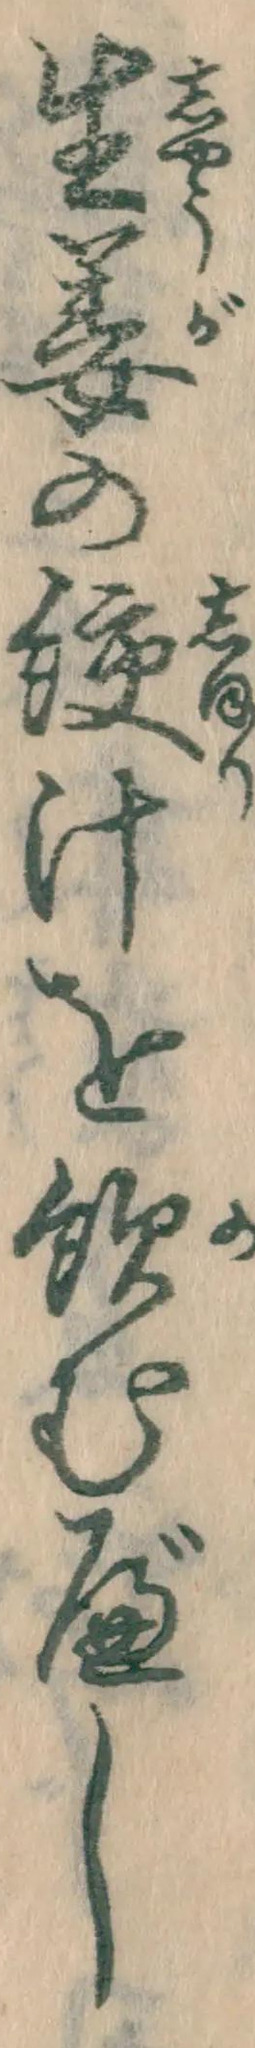生姜の絞汁を飲むべし
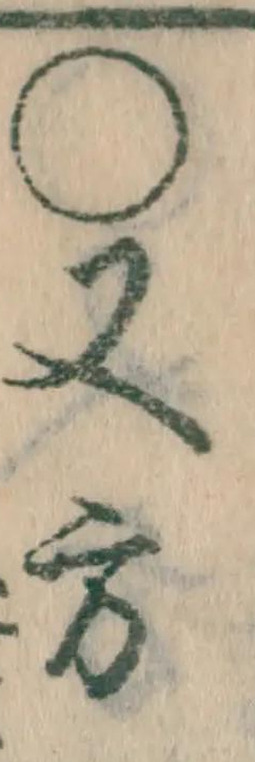〇又方
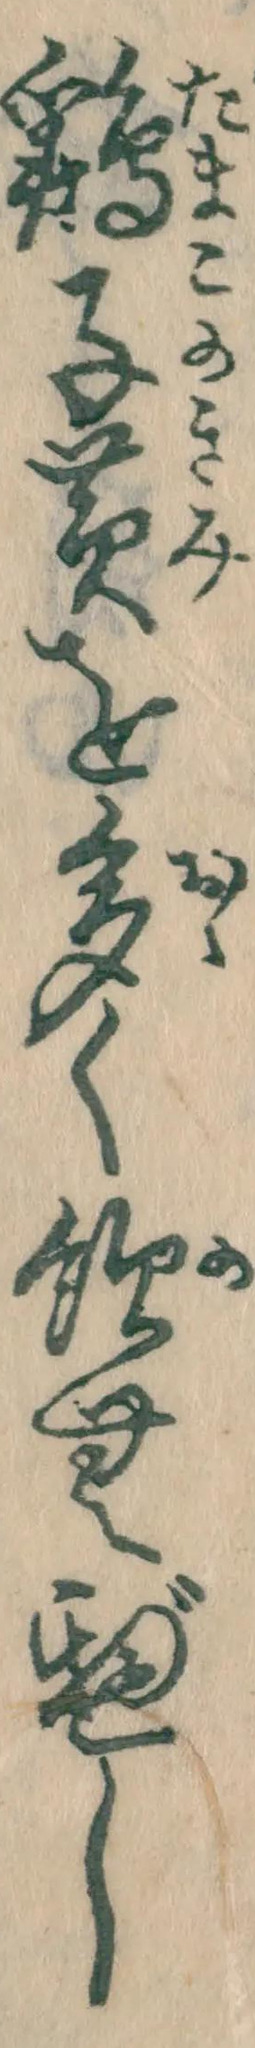鶏子黄を多く飲むべし
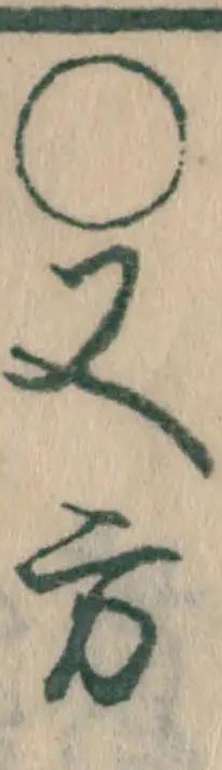〇又方

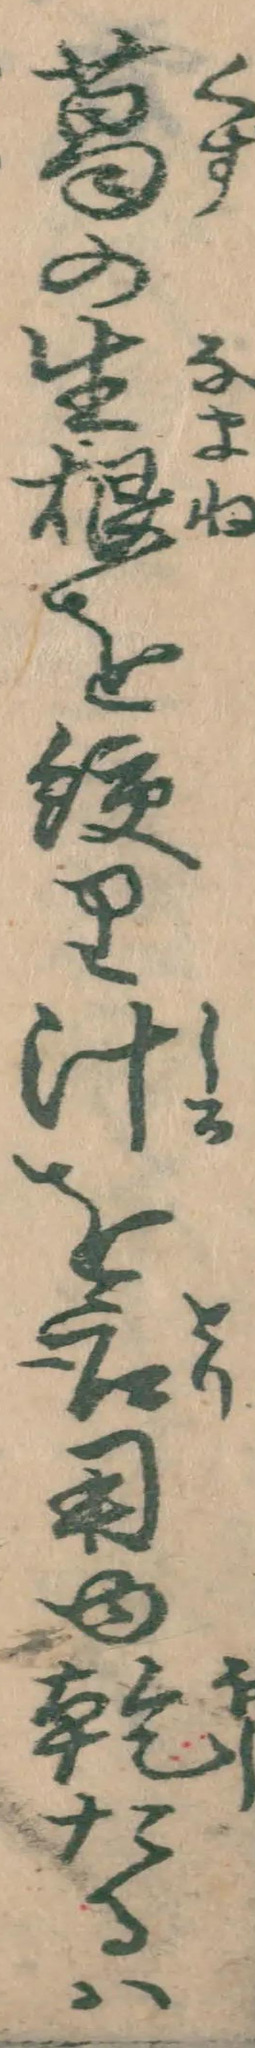葛の生根を絞り汁を取用ゆ乾たるは
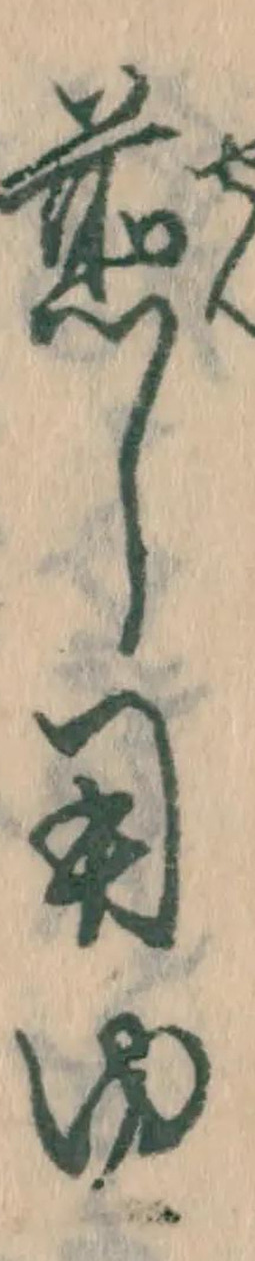煎し用ゆ
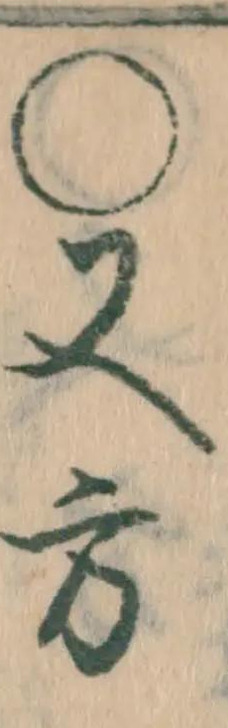〇又方
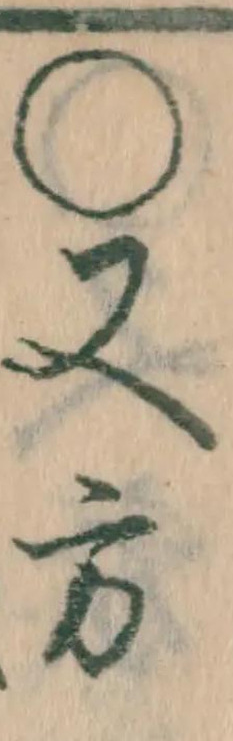〇又方
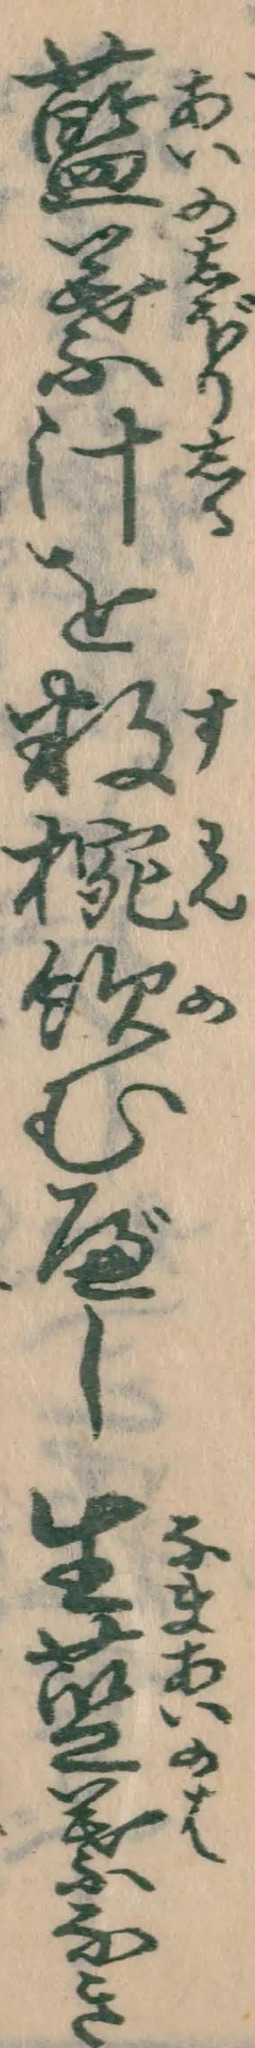藍葉汁を数椀飲むべし生藍葉なき
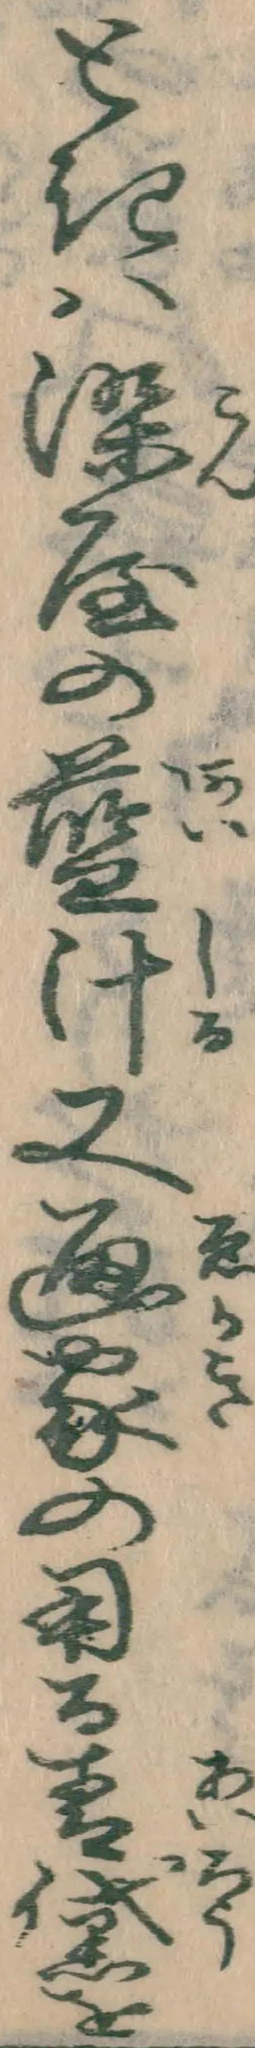ときは染屋の藍汁又画家の用る青黛を
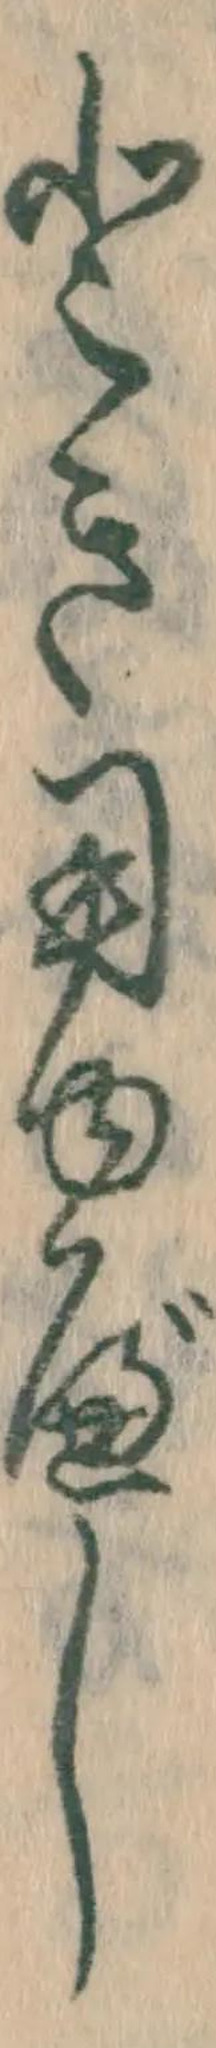とき用ゆべし
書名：救荒鄙諭
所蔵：国立国会図書館 National Diet Library, JAPAN
